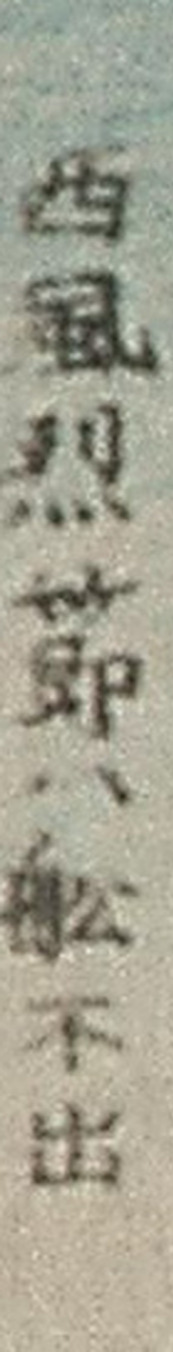西風烈節ハ船不出
